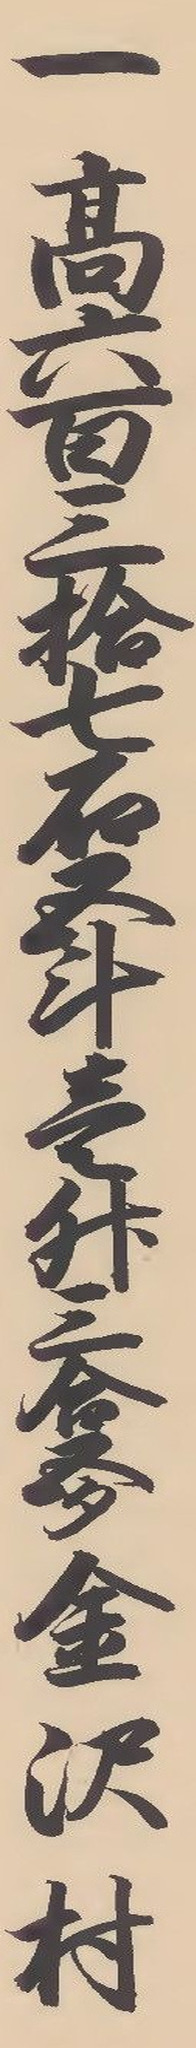一高六百三拾七石五斗壱升三合五勺金沢村
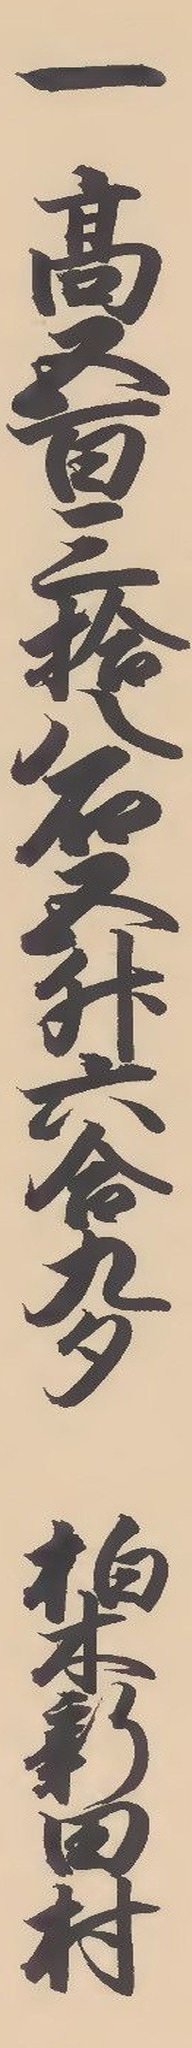一高五百三拾八石五升六合九勺柏木新田村

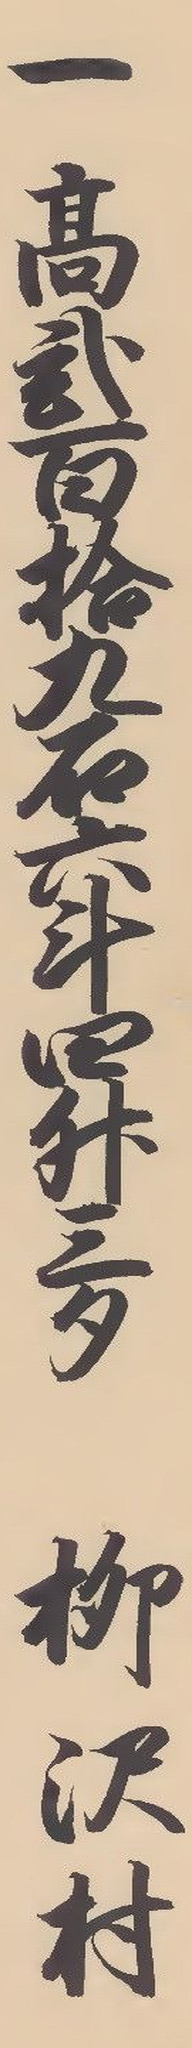一高弐百拾九石六斗四升三勺柳沢村
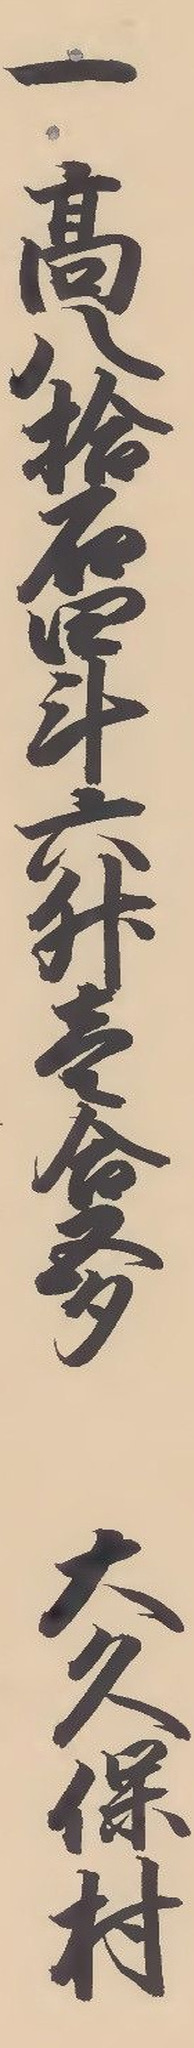一高八拾石四斗六升壱合五勺大久保村
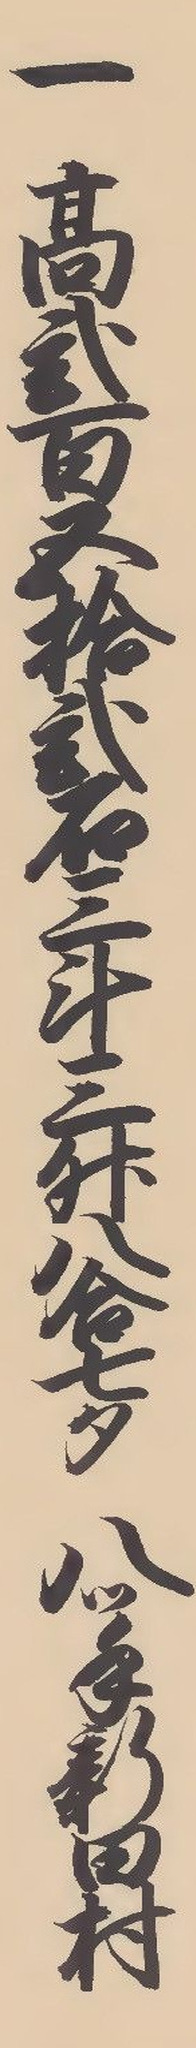一高弐百五拾弐石三斗三升八合七勺八ッ手新田村
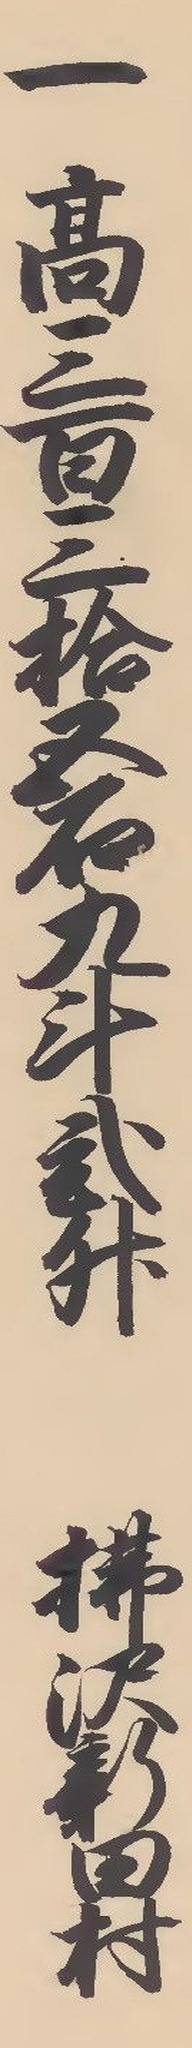一高三百三拾五石九斗弐升払沢新田村
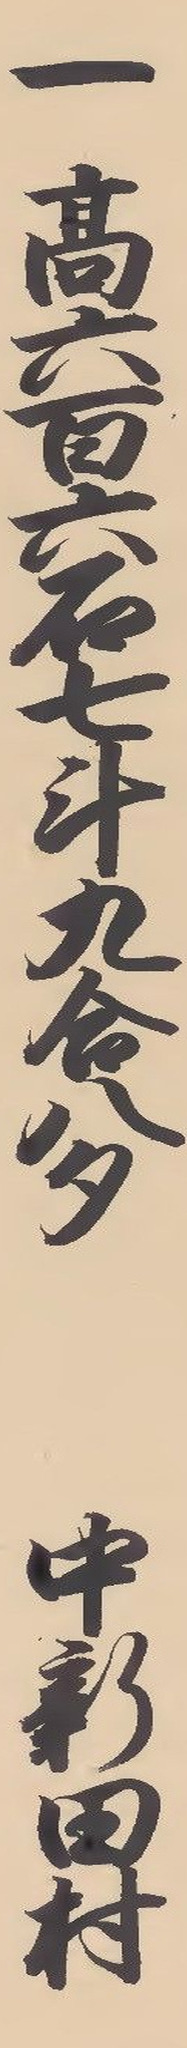一高六百六石七斗九合八勺中新田村
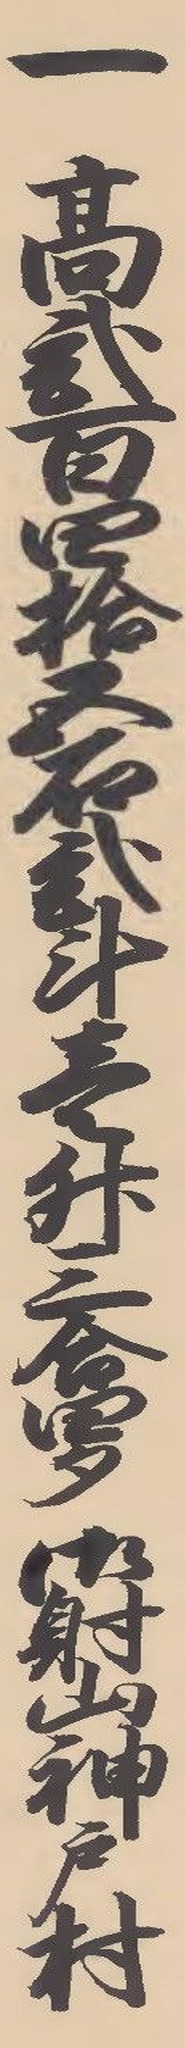一高弐百四拾五石弐斗壱升三合四勺御射山神戸村
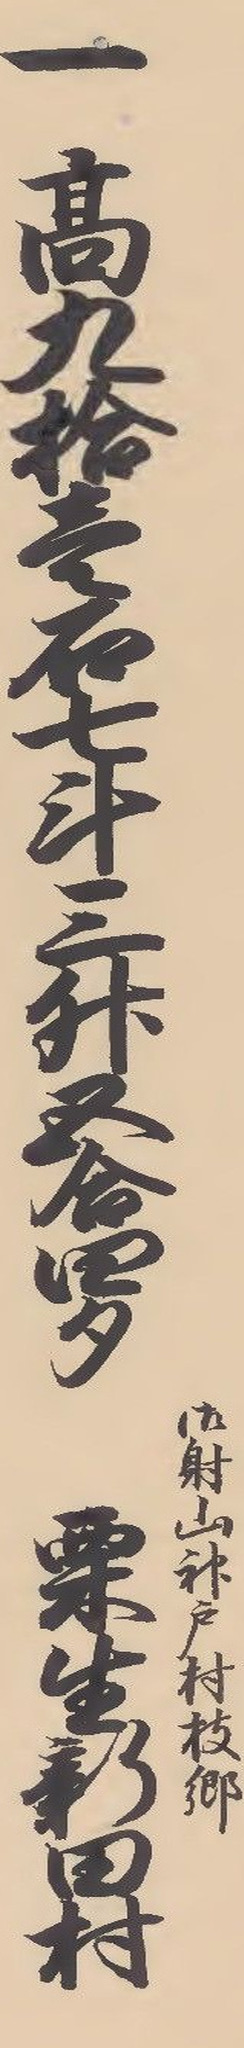一高九拾壱石七斗三升五合四勺栗生新田村
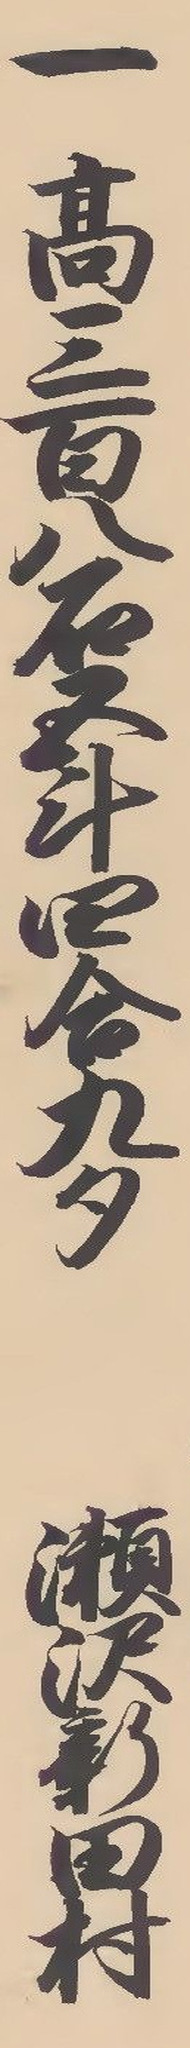一高三百八石五斗四合九勺瀬沢新田村

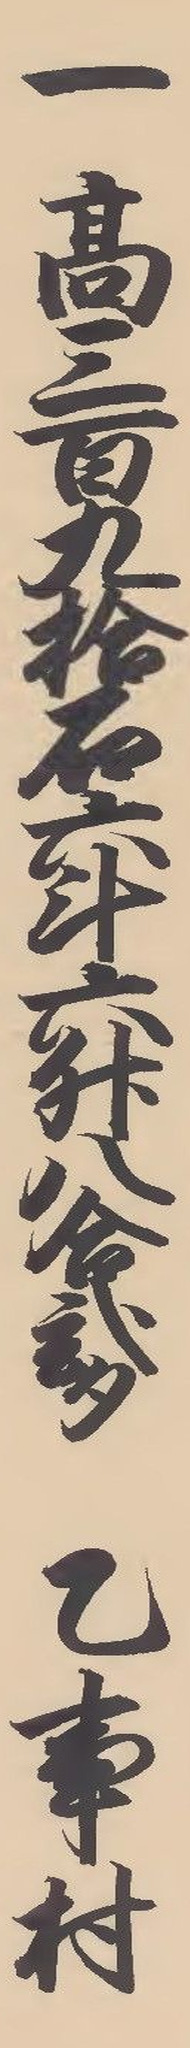一高三百九拾石六斗六升八合弐勺乙事村
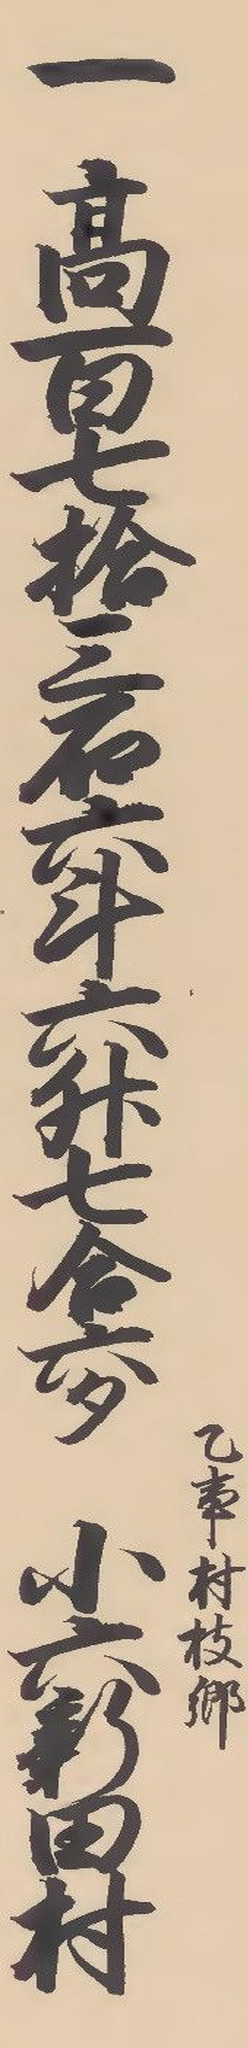一高百七拾三石六斗六升七合六勺小六新田村
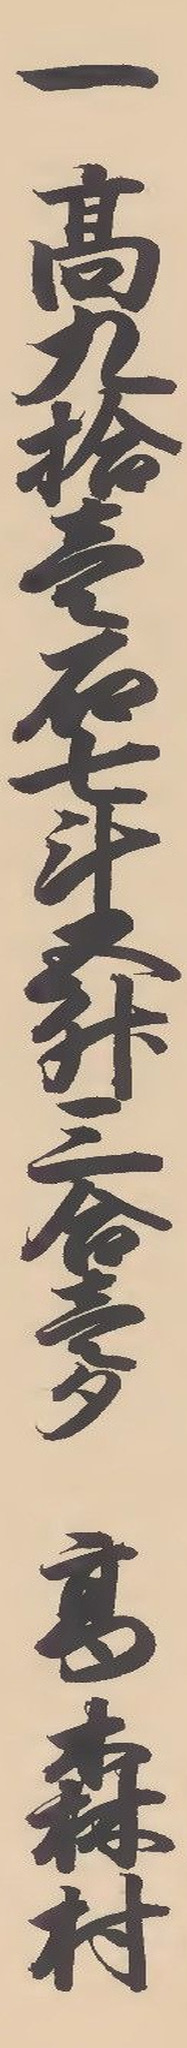一高九拾壱石七斗五升三合壱勺高森村
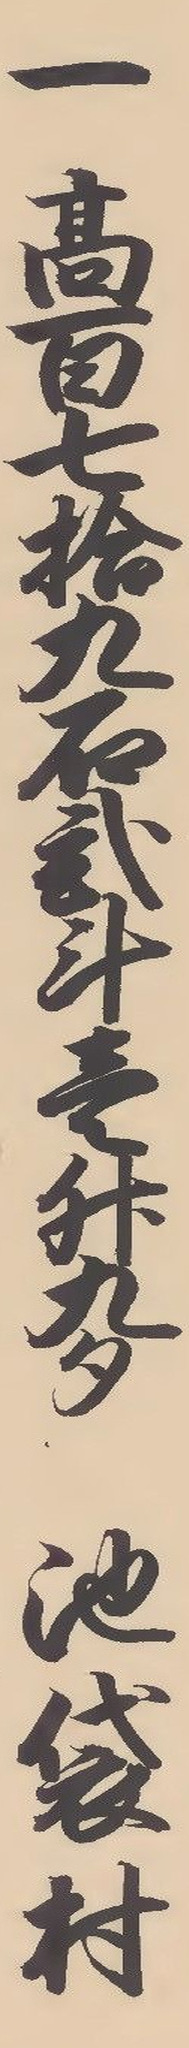一高百七拾九石弐斗壱升九勺池袋村
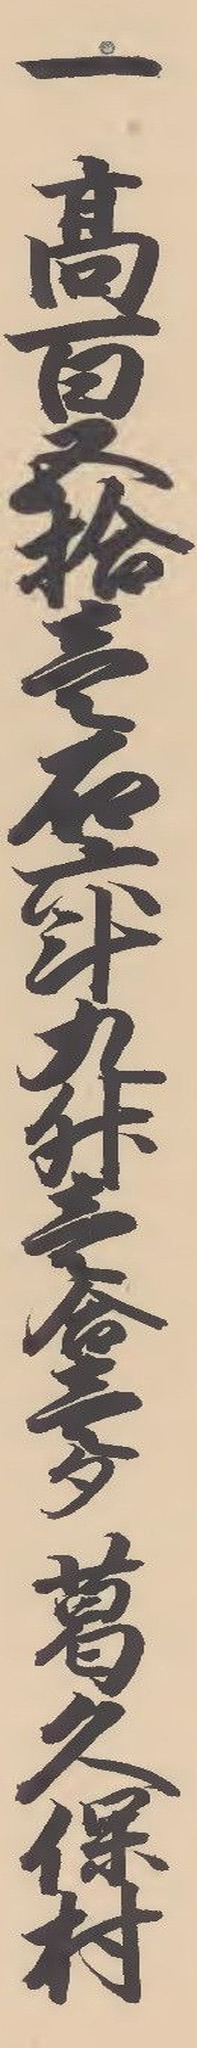一高百五拾壱石六斗九升壱合壱勺葛久保村
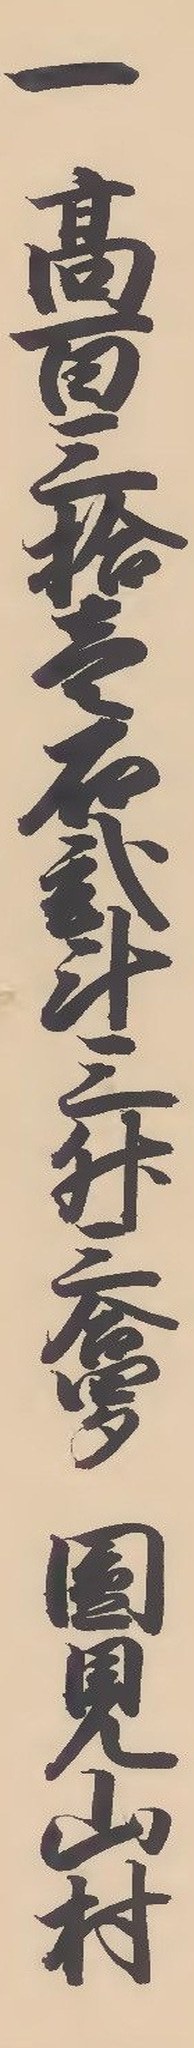一高百三拾壱石弐斗三升三合四勺円見山村
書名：信濃国郷帳
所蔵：国立公文書館 National Archives of Japan
